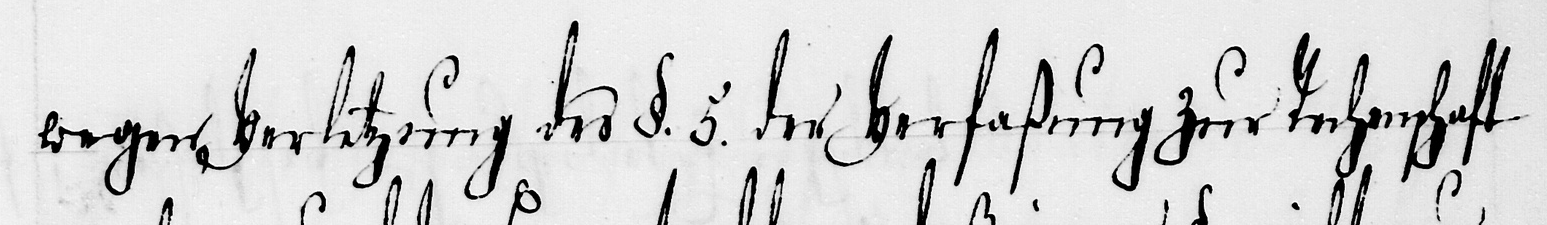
wegen Verletzung des §. 5. der Verfaßung zur Rechenschaft
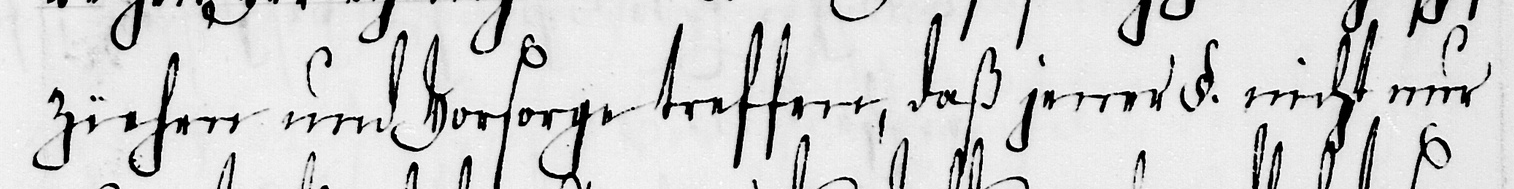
ziehen und Vorsorge treffen, daß jener §. nicht nur
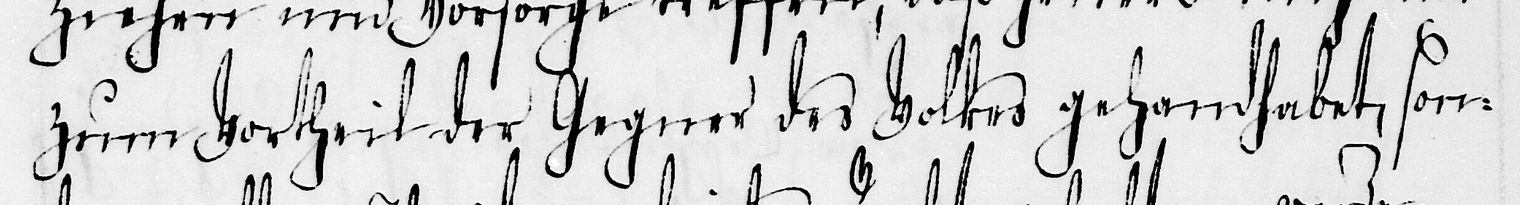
zum Vortheil der Gegner des Volkes gehandhabet, son¬
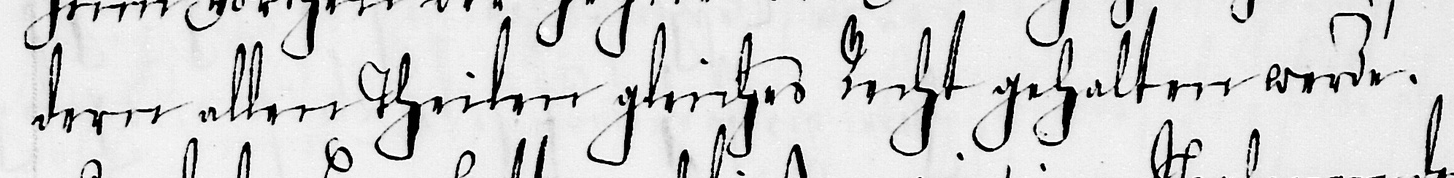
dern allen Theilen gleiches Recht gehalten werde.
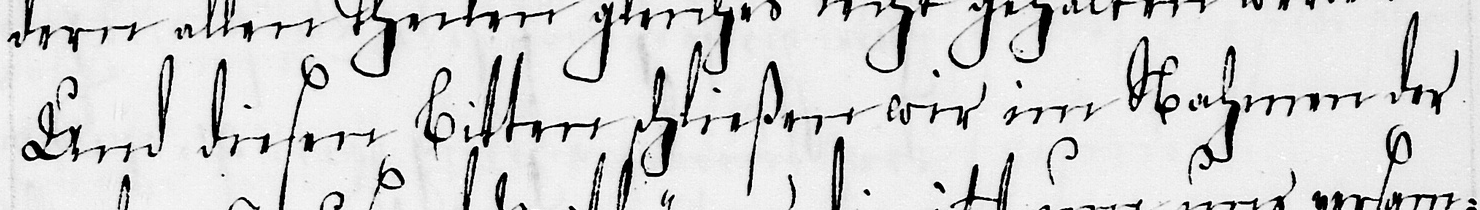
Und diesen Bitten schließen wir im Nahmen der
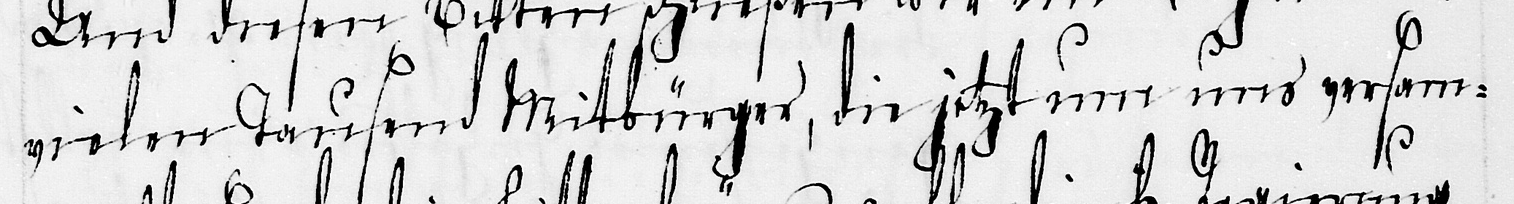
vielen Tausend Mittbürger, die jetzt um uns versam¬
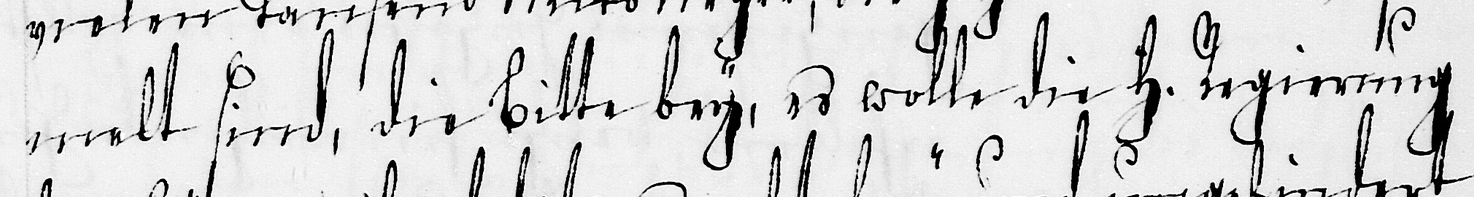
melt sind, die Bitte bey, es wolle die H. Regierung
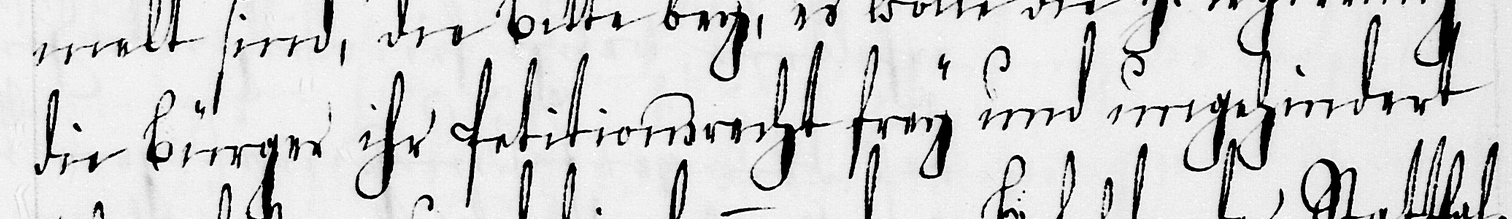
die Bürger ihr Petitionsrecht frey und ungehindert
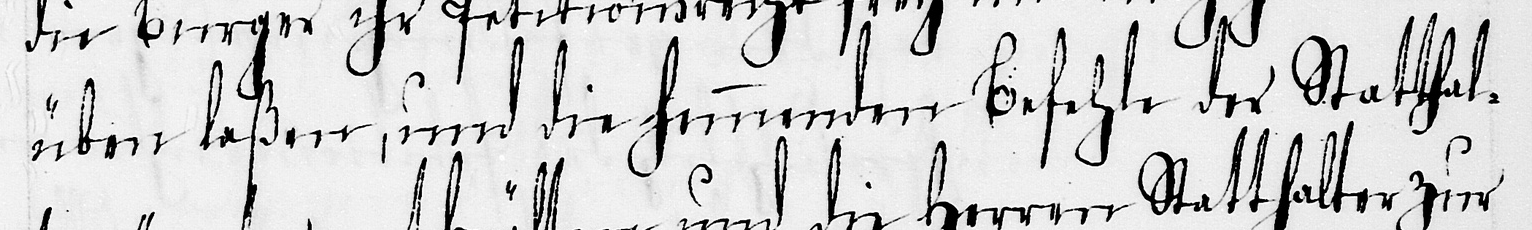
üben laßen, und die hemmenden Befehle der Statthal¬
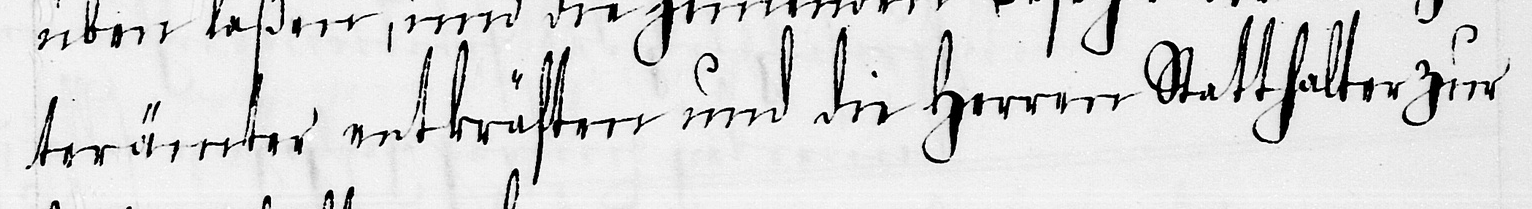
terämter entkräften und die Herren Statthalter zur
